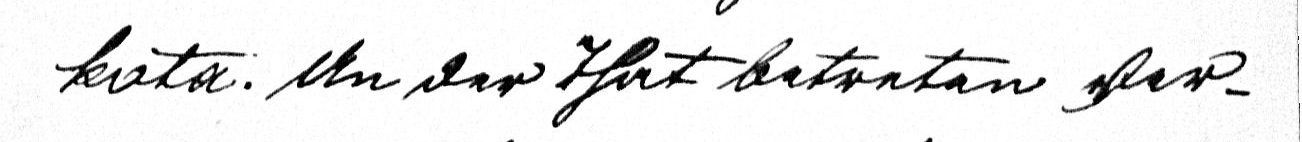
kota. An der That betreten ver¬
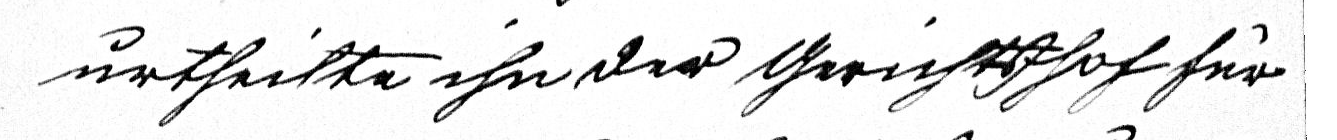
urtheilte ihn der Gerichtshof für
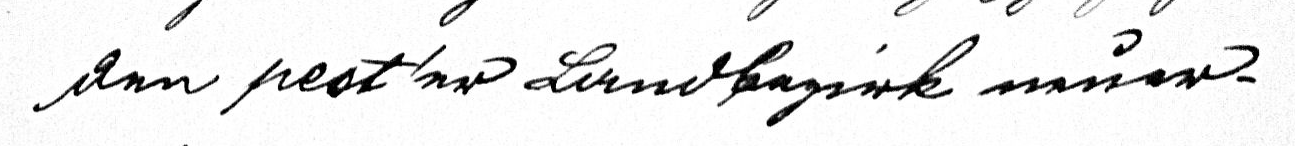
den pest'er Landbezirk neuer¬
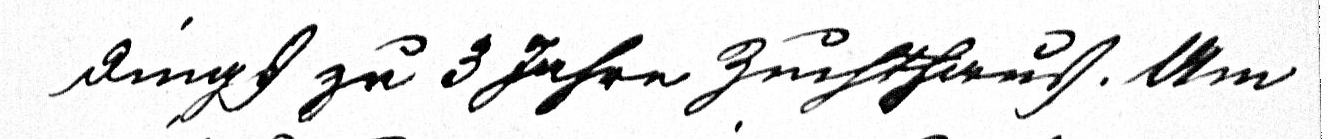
dings zu 3 Jahre Zuchthaus. Am
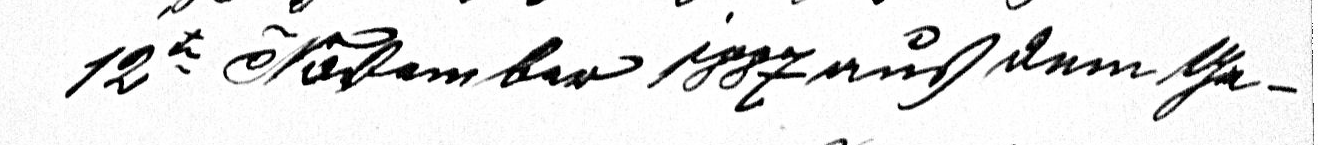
12ten November 1887 und dem Ge¬
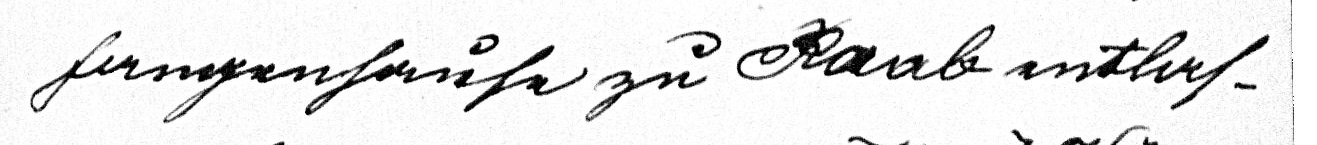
fangenhause zu Raab entlas¬
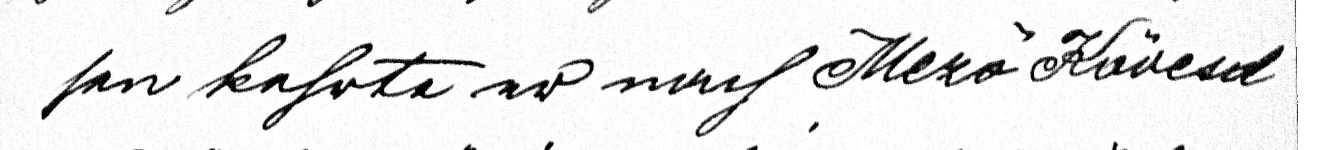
sen kehrte er nach Mezö Kövesd
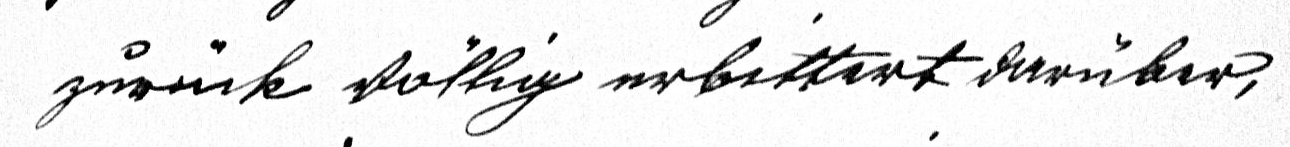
zurück völlig erbittert darüber,
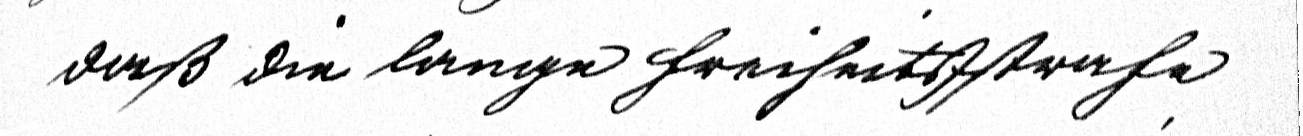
daß die lange Freiheitsstrafe
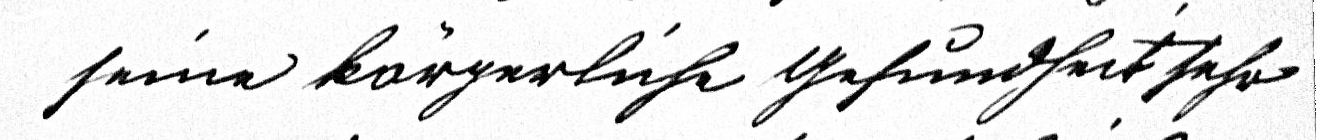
seine körperliche Gesundheit sehr
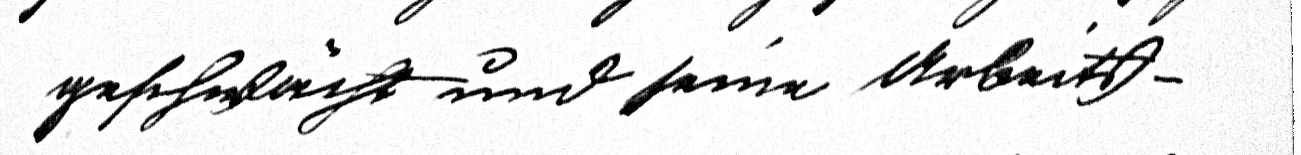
geschwächt und seine Arbeits¬
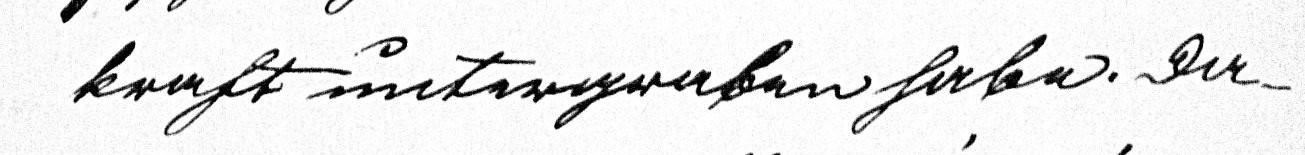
kraft untergraben habe. Da¬
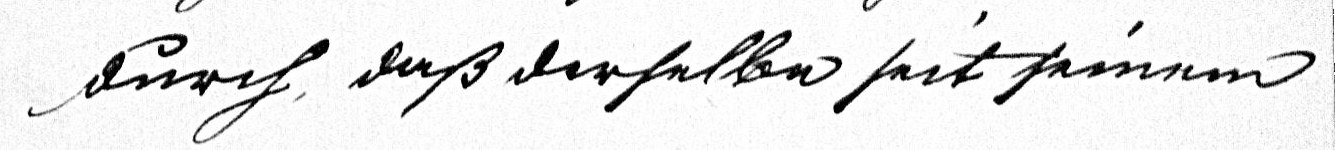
durch, daß derselbe seit seinem
